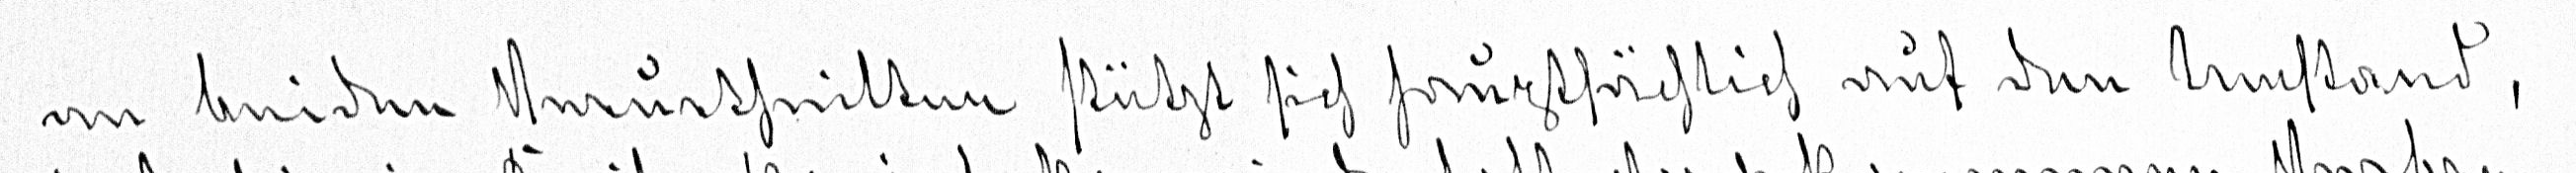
an beiden Verurtheilten stützt sich hauptsächlich auf den Anstand,
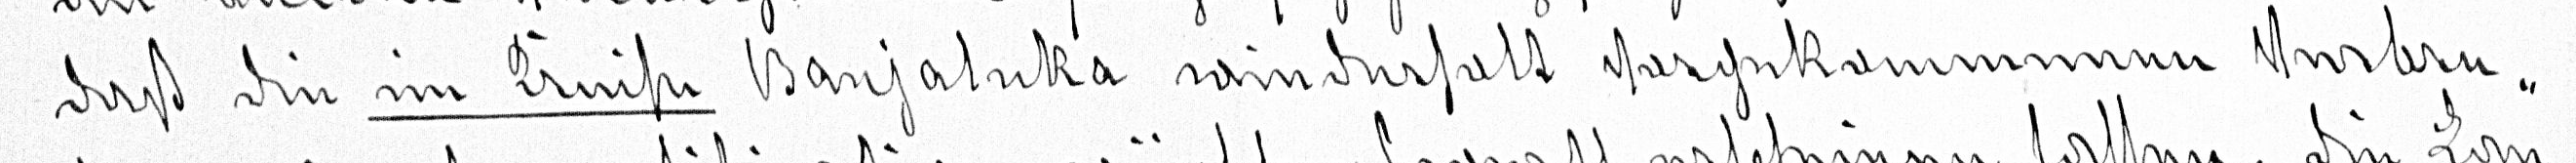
daß die im Kreise Banjaluka wiederhalt vorgekommenen Verbre¬
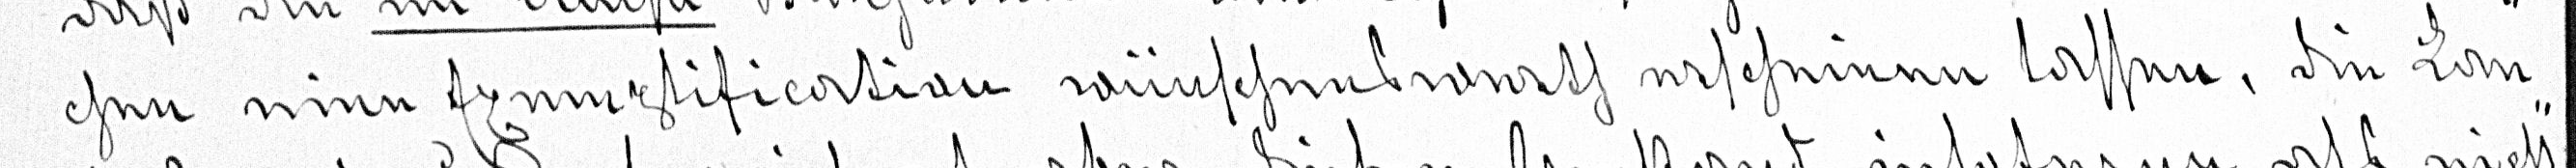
chen eine Examplification wünschenswerth erscheinen lassen, die kom¬
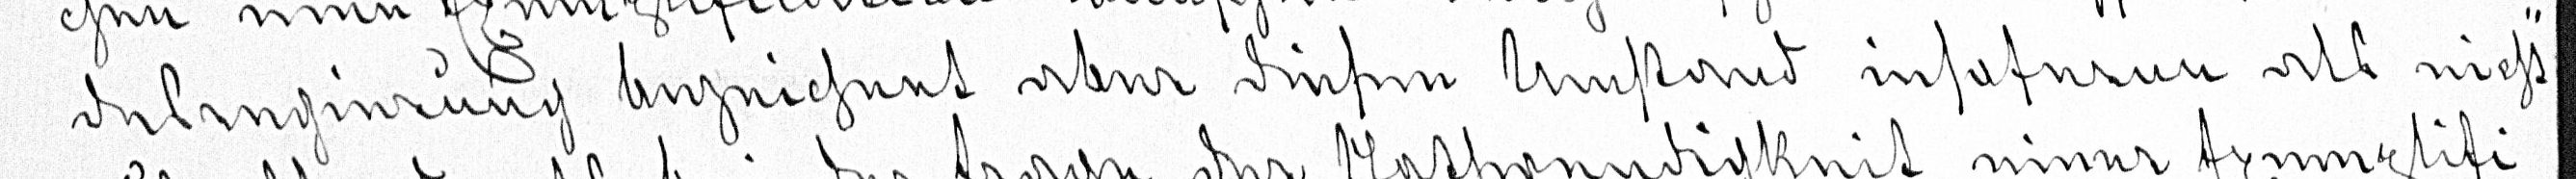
desengierung bezeichnet aber diesen Anstand insoferen als nicht
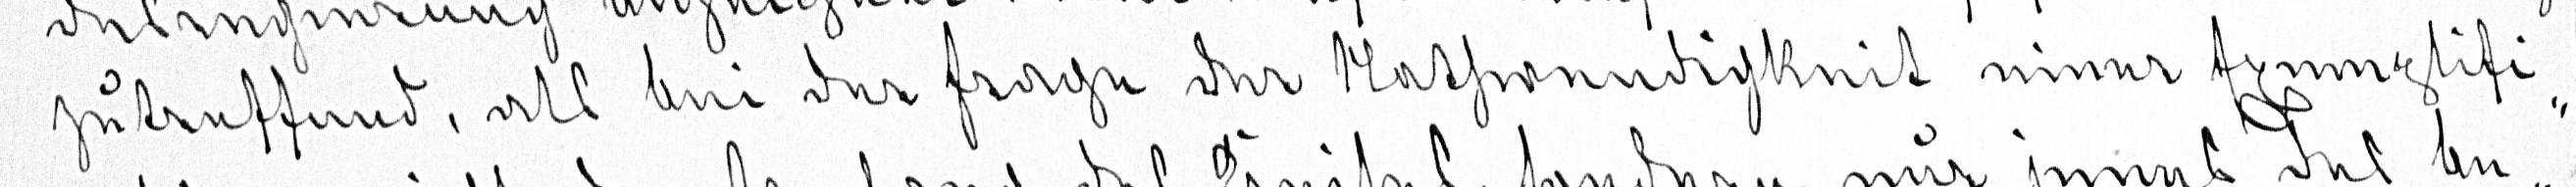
zutreffend, als bei der Frage der Nothwendigkeit einer Exampfli¬
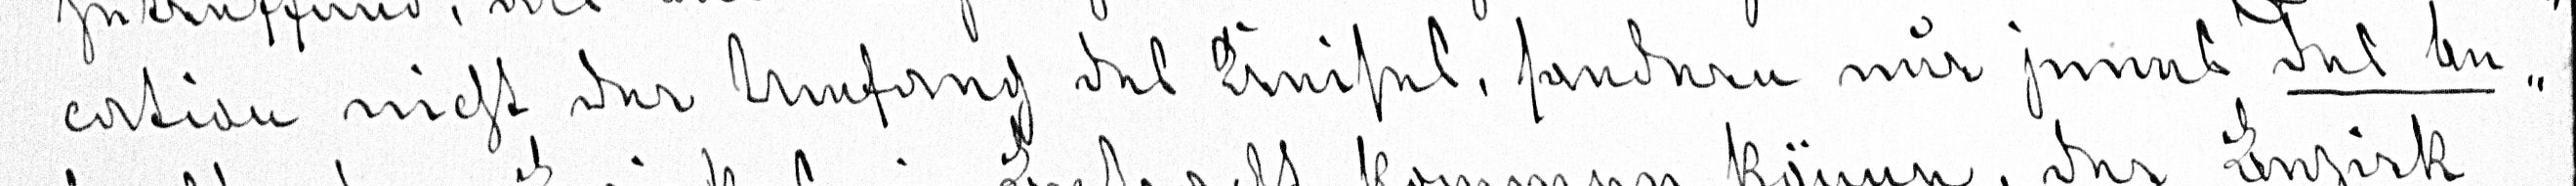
fication nicht der Umfang des Kreises, sondern nur jenes des be¬
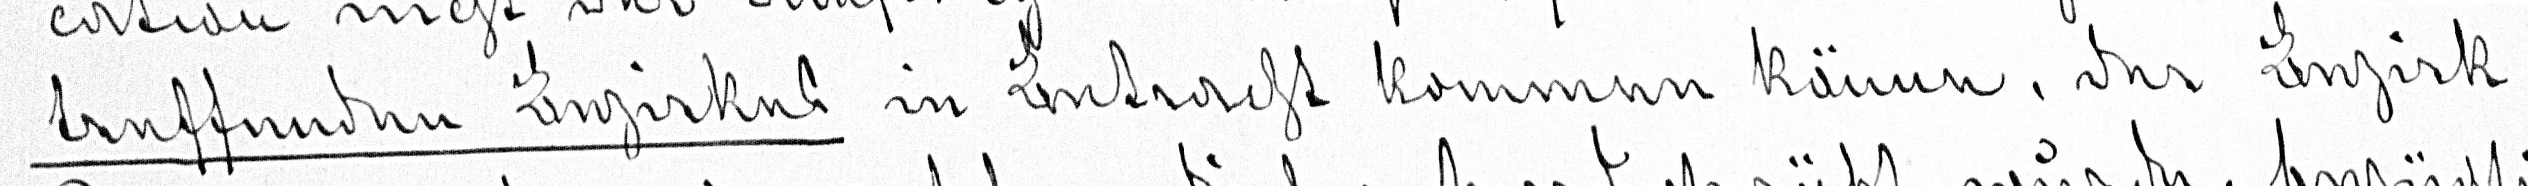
treffenden Bezirkes in Betragt kommen könne, der Bezirk
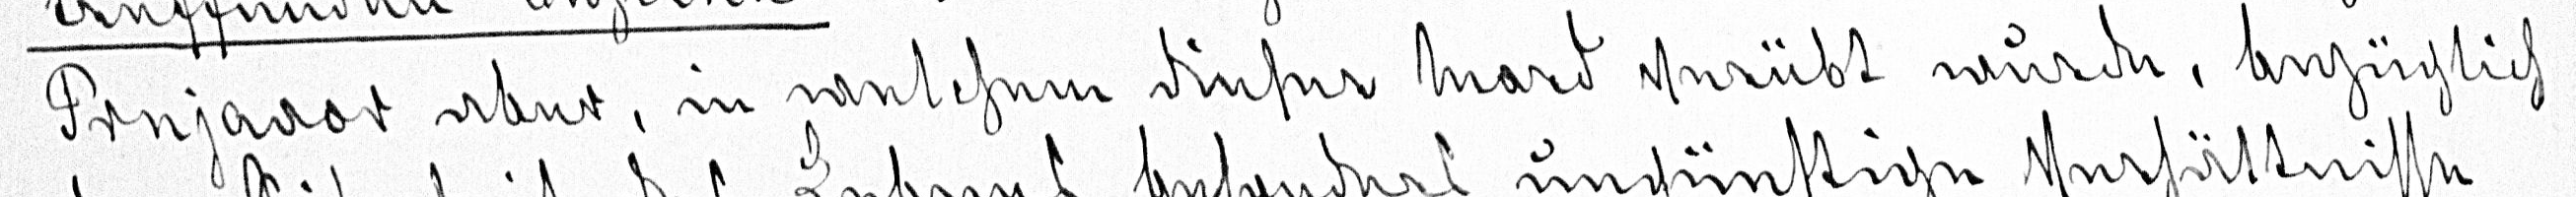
Prnjavor aber, in welchem dieser mord verübt wurde, bezüglich
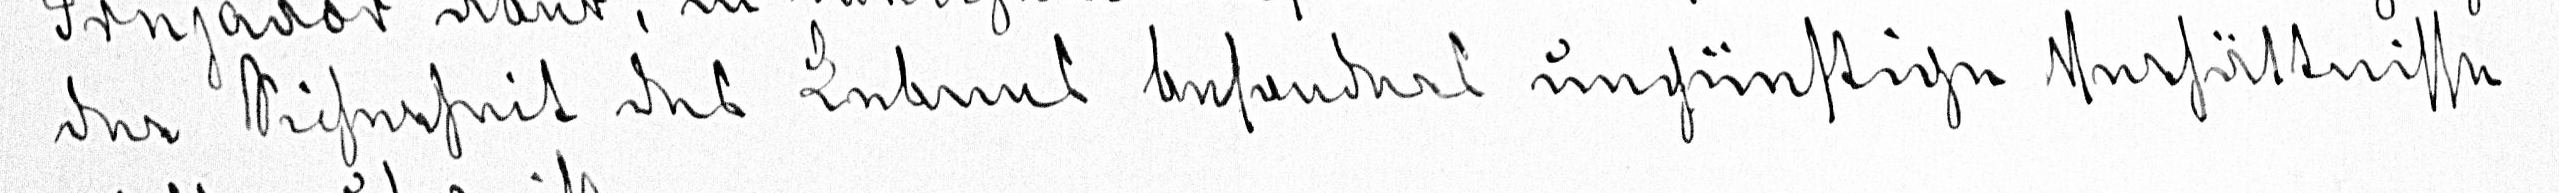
der Sicherheit des Lebens besonders ungünstige Verhättnisse
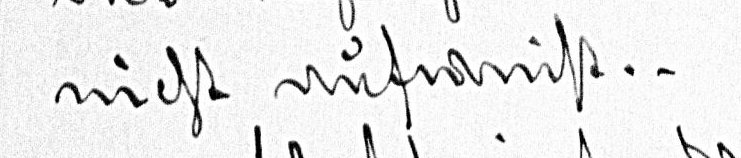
nicht aufweist.
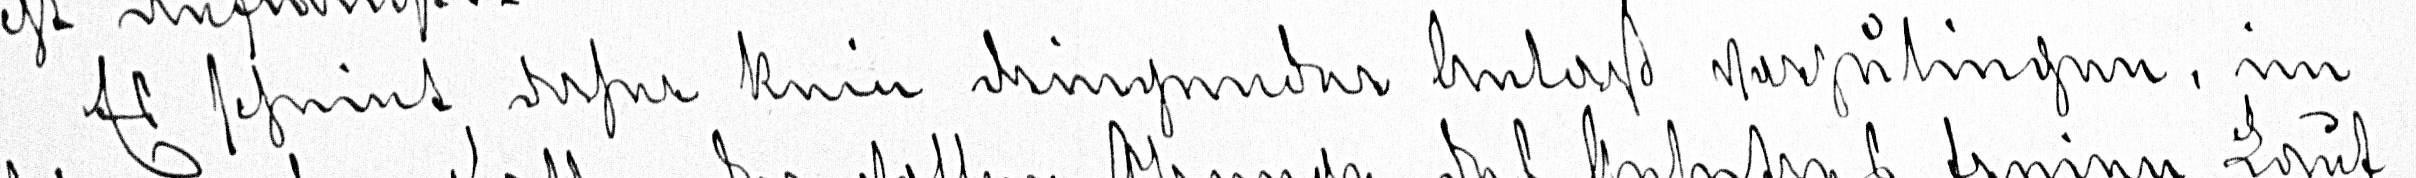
Es scheint daher kein dingender belaß verzulingen, im
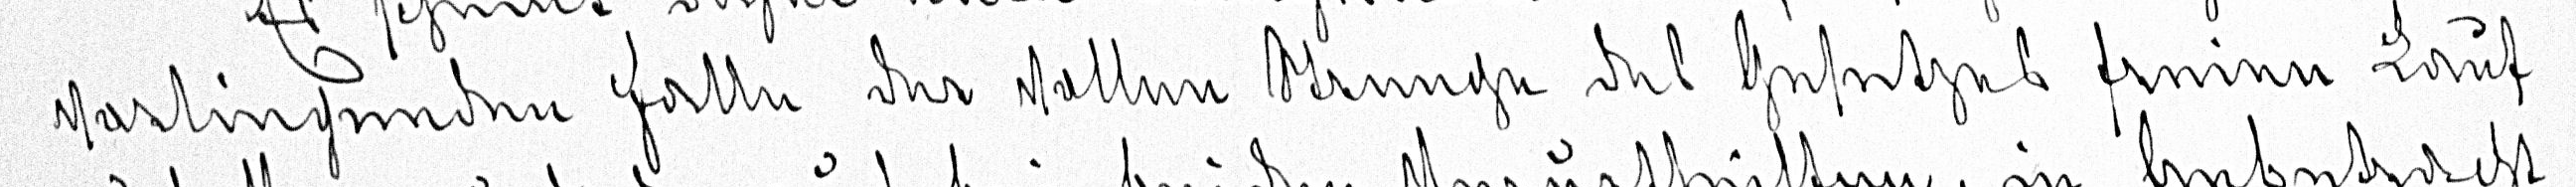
vorliegenden falle der vollen Strenge des Gesetzes seinen Lauf
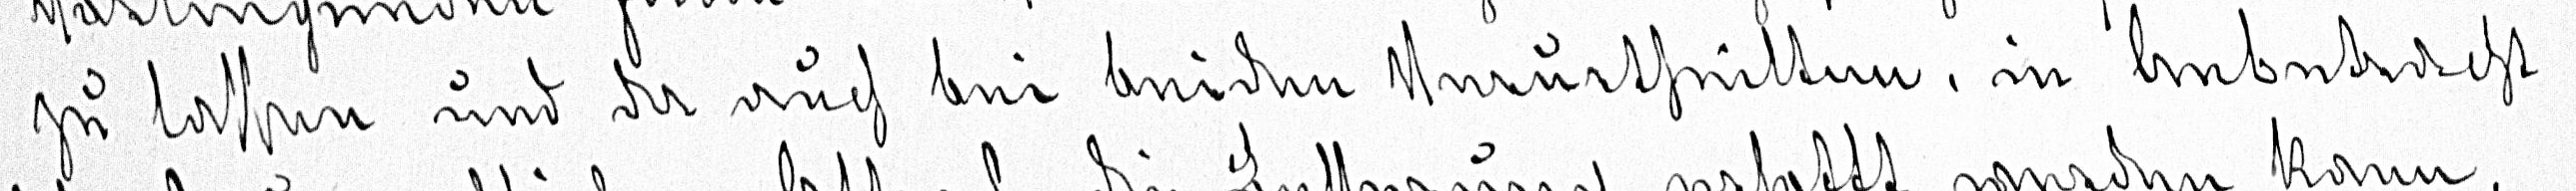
zu lassen und da auch bei beiden Verurtheilten, in Anbetracht
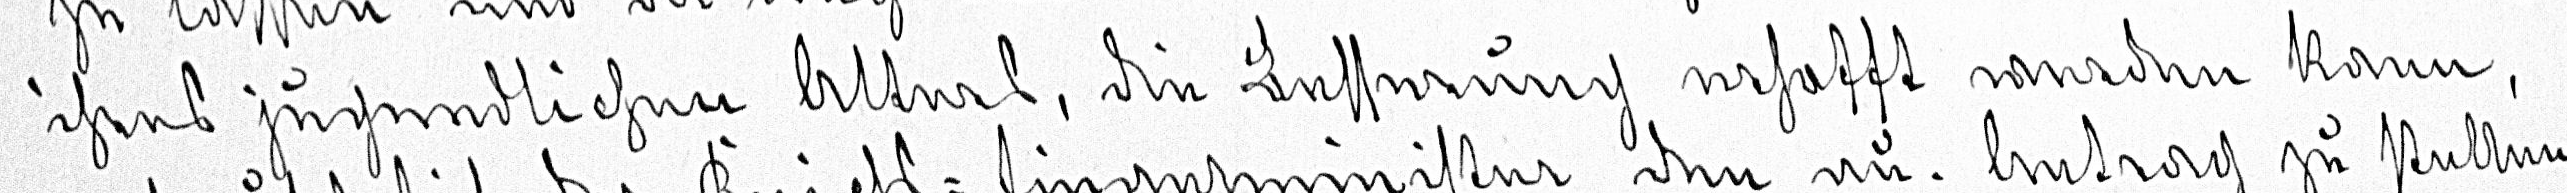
ihres jugendlichen Alters, die Besserung erhofft worden kann,
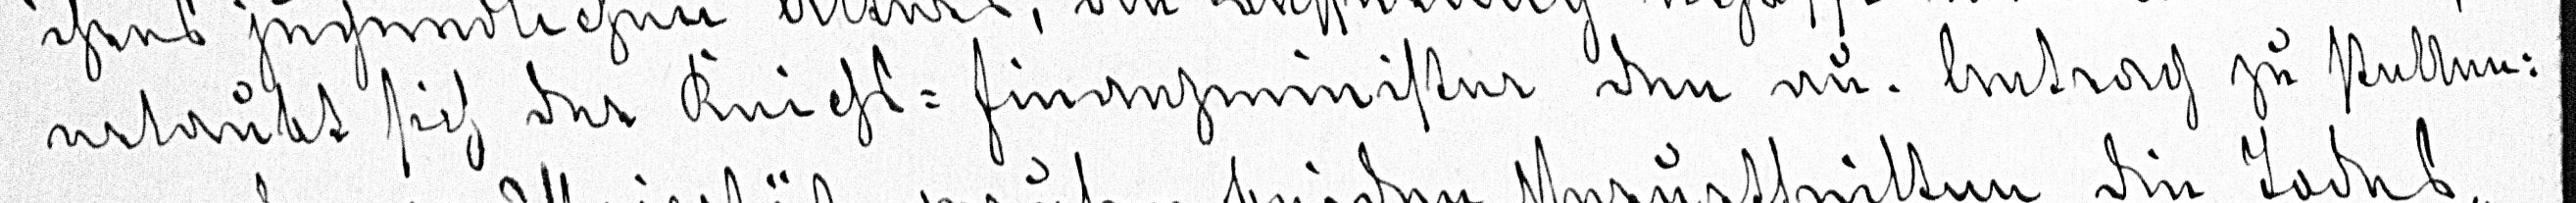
erlaubt sich der Reichs = Finanzminister den au. Antrag zu stellen:
